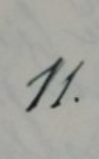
11
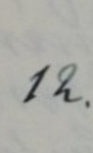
12
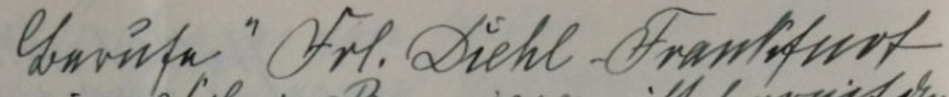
Bunde" Frl. Diehl - Frankfurt
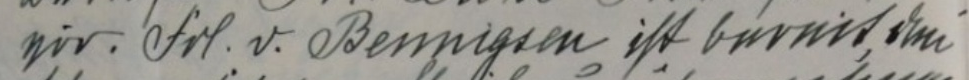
vor. Frl. v. Bennigsen ist bereit den
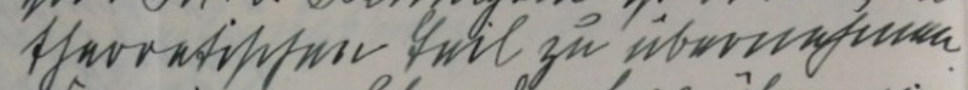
theoritischen Teil zu übernehmen.
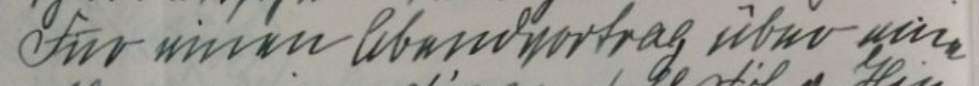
Für einen Abendvortrag über eine
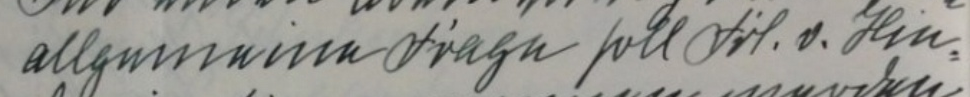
allgemeine Frage soll Frl. v. Hun
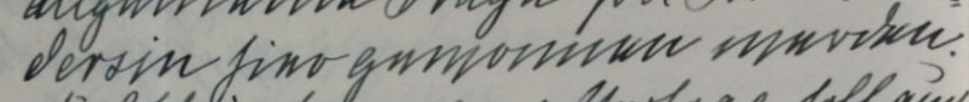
dersin hier gewonnen werden.
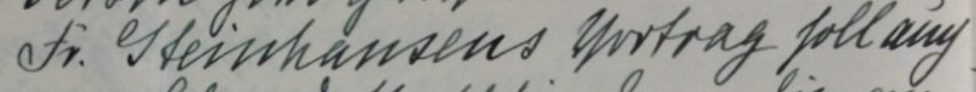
Fr. Steinhausens Vortrag soll auch
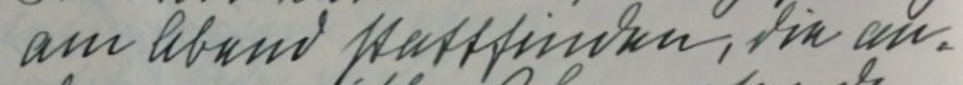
am Abend stattfinden, die an
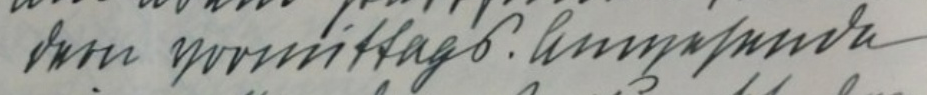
deren Vormittags, Anwesende
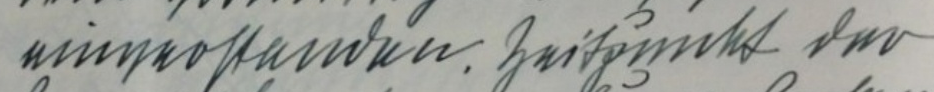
einverstadnen. Zeitpunkt der
